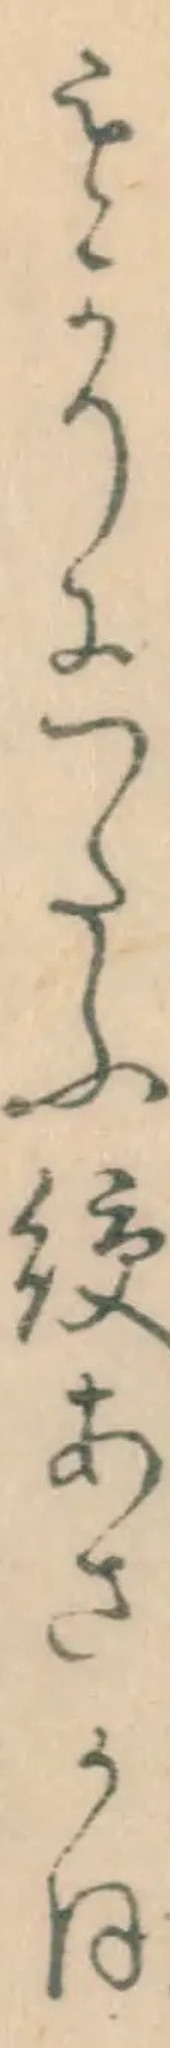もかりにつたふ絞あさかほ
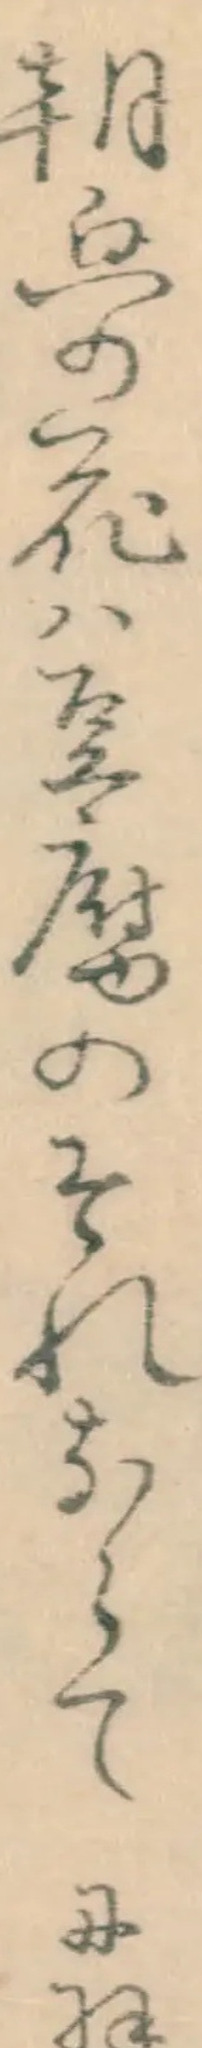朝貌の花ハ豆腐のそれならて丹羽
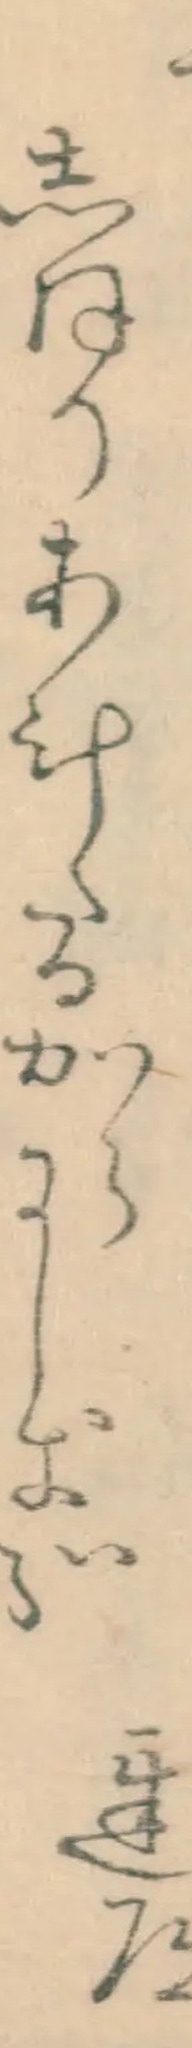しほりあけたるからにしきいろ達道
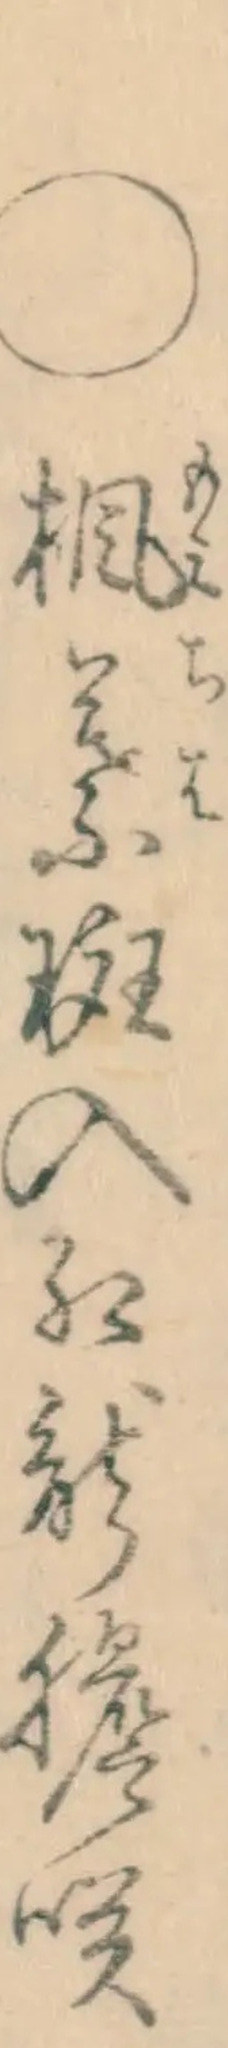〇楓葉斑入紅龍胆咲
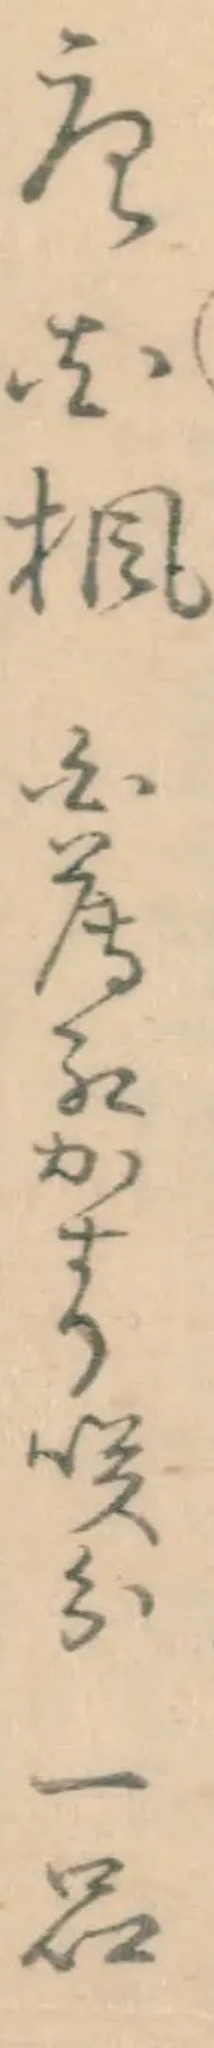唐花楓花薄紅かすり咲分一品
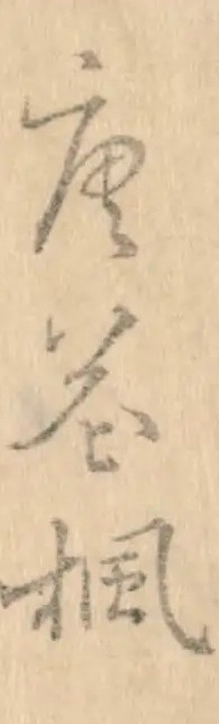唐花楓

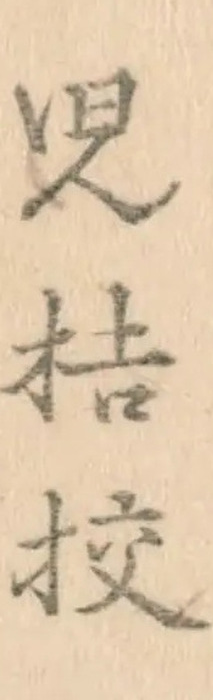児桔梗
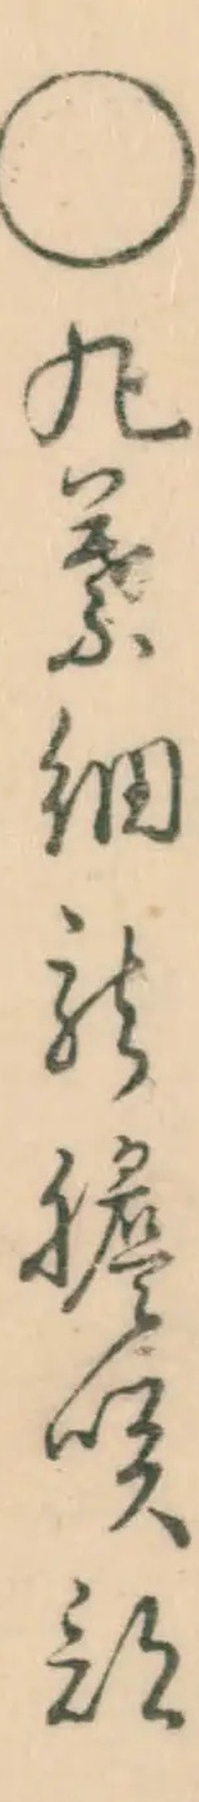〇九葉細龍胆咲部
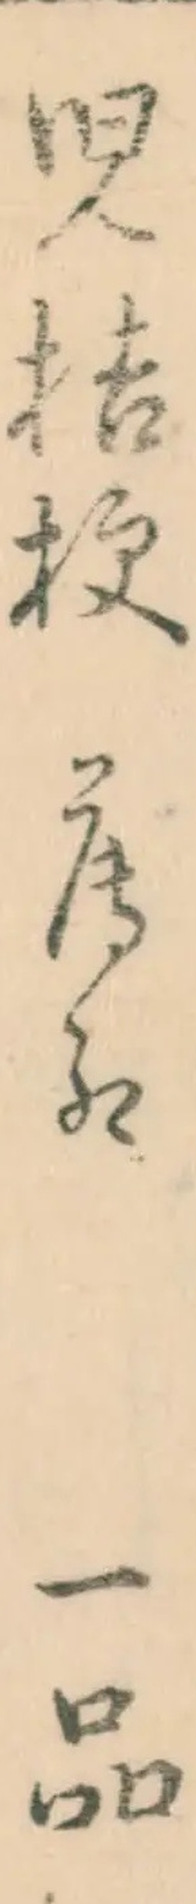児桔梗薄紅一品
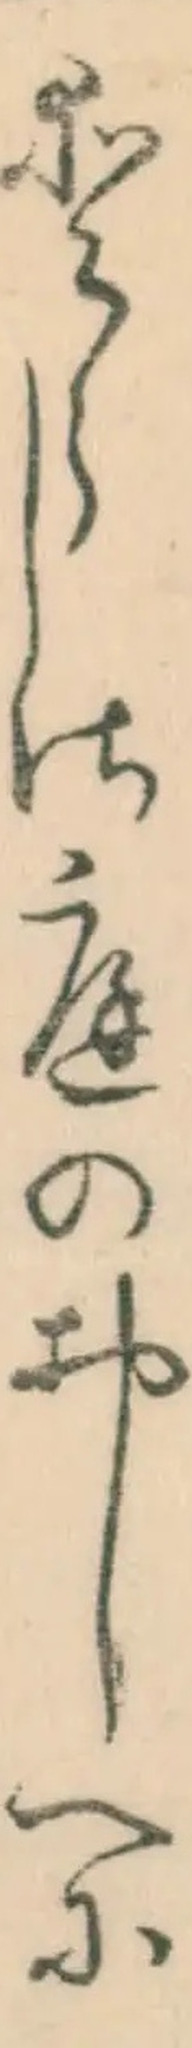らしの庭のおしへに真顔
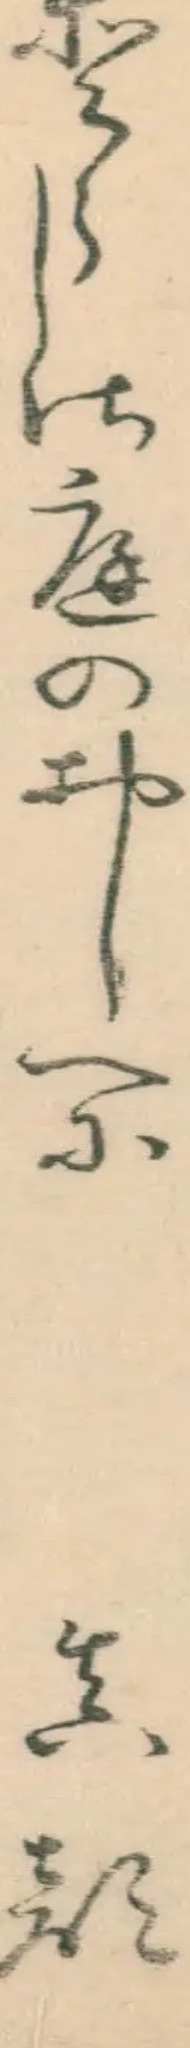らしの庭のおしへに真顔
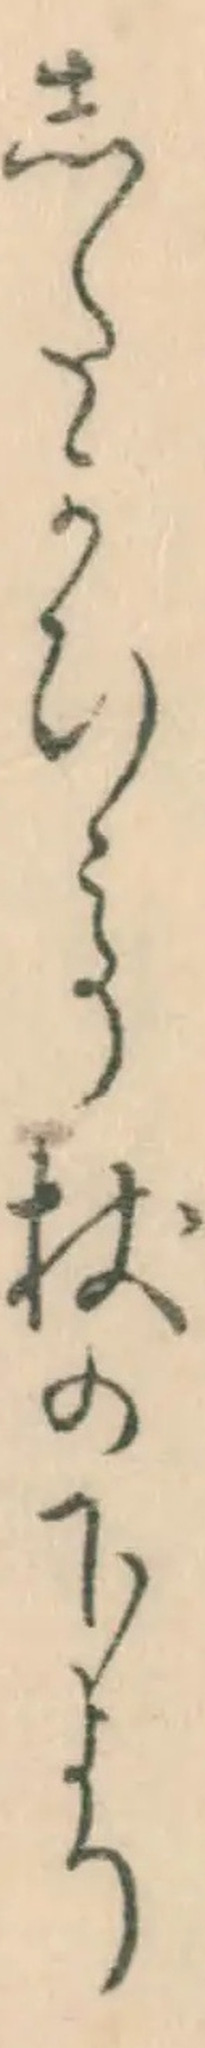したかひて杖の下より
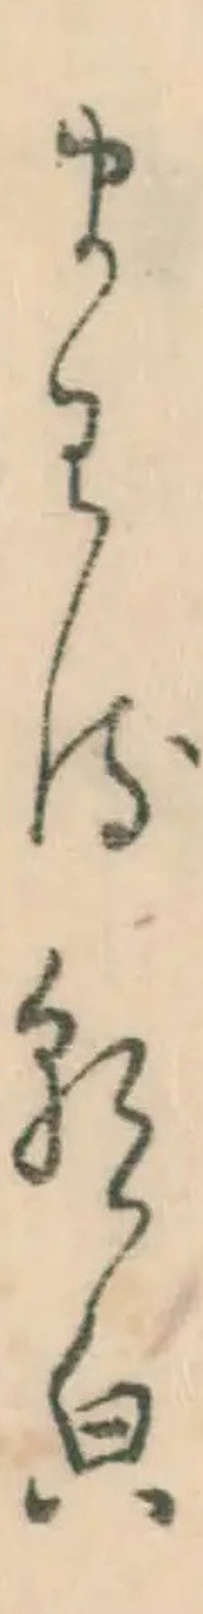まわる朝貌
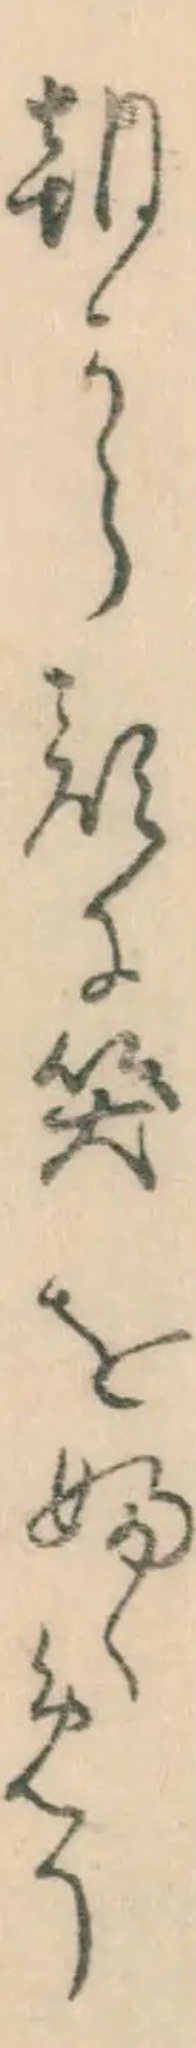朝から顔に笑をふくめり

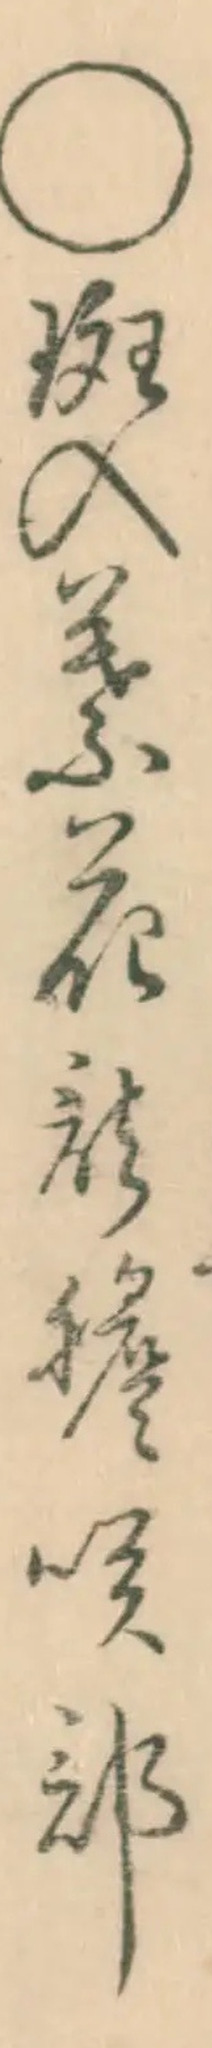〇斑入り葉花龍胆咲部
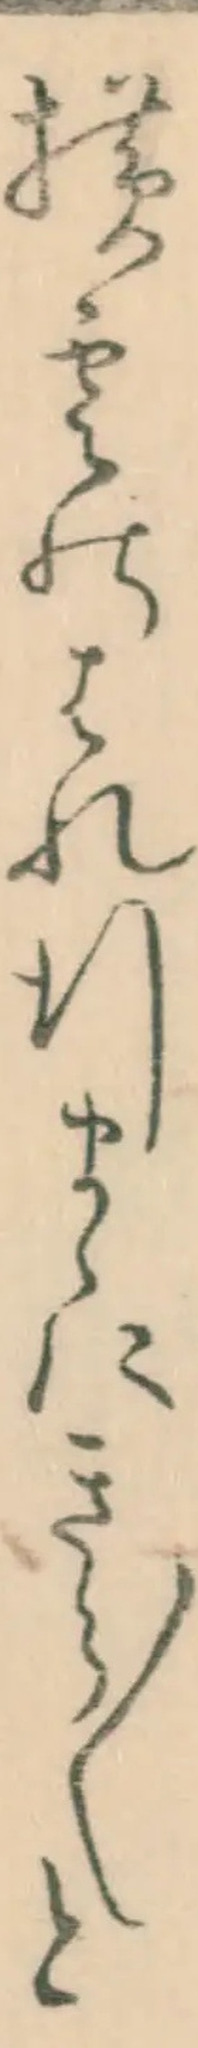横雲のはれ行まゝにきら〳〵と廣海
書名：花壇朝顔通 2巻. [2]
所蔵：国立国会図書館 National Diet Library, JAPAN
